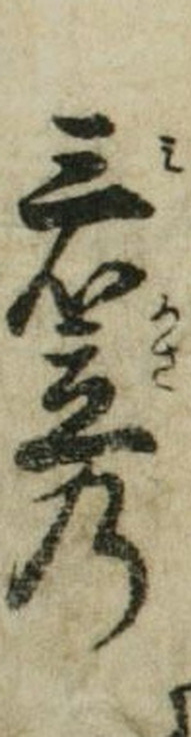三笠の
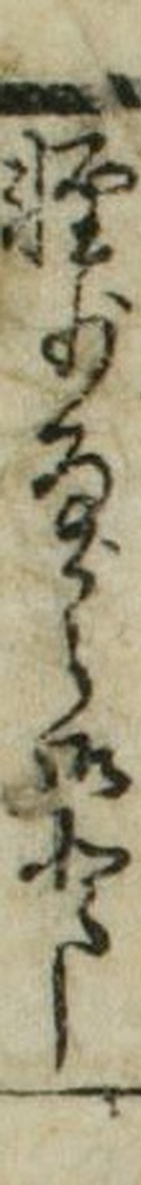軽少ながら御とし
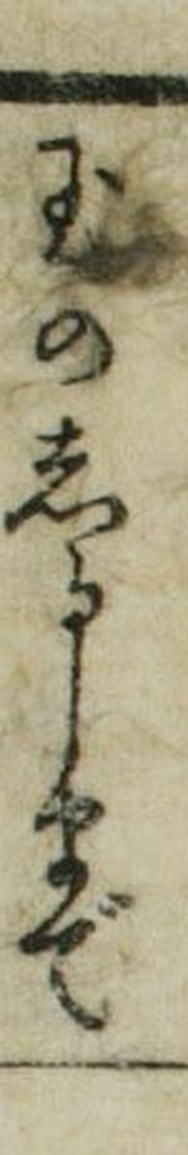玉のしるしまで
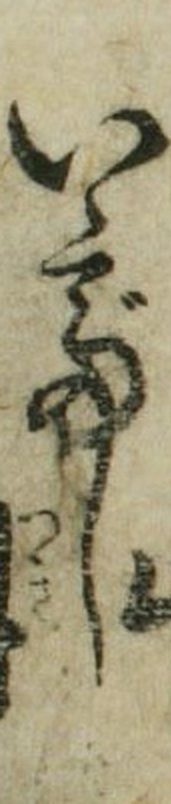いでし
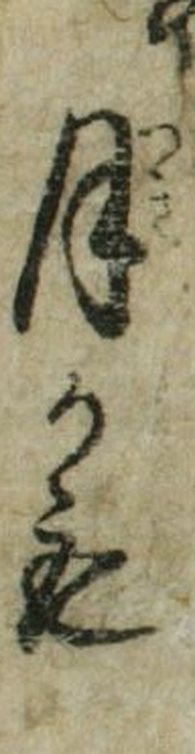月かも

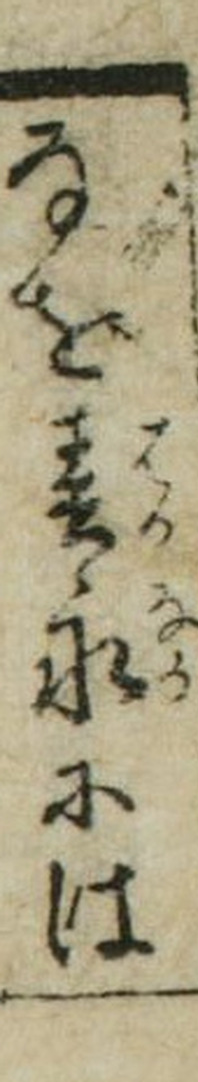なを春永には
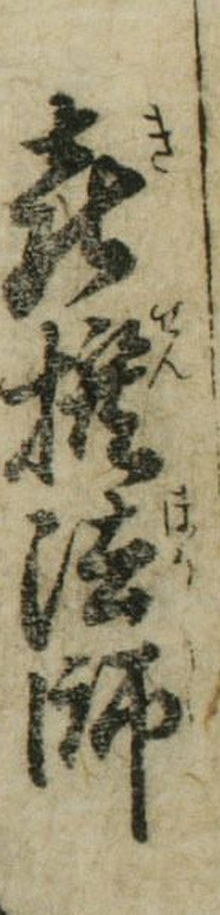喜撰法師
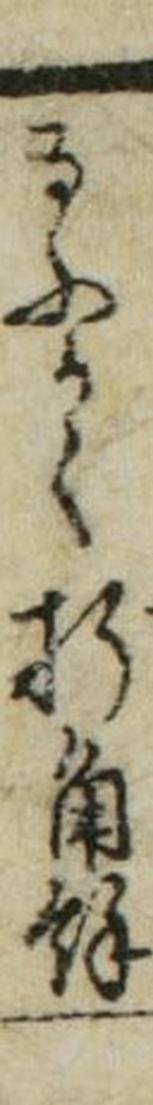るふかく折角余
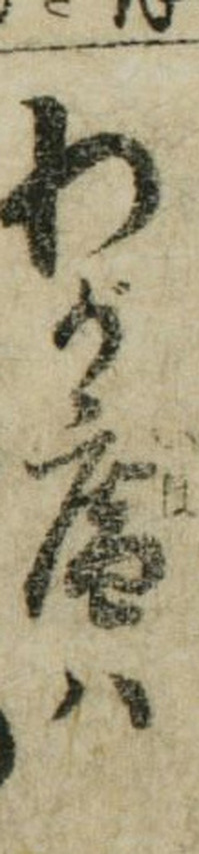わが庵は
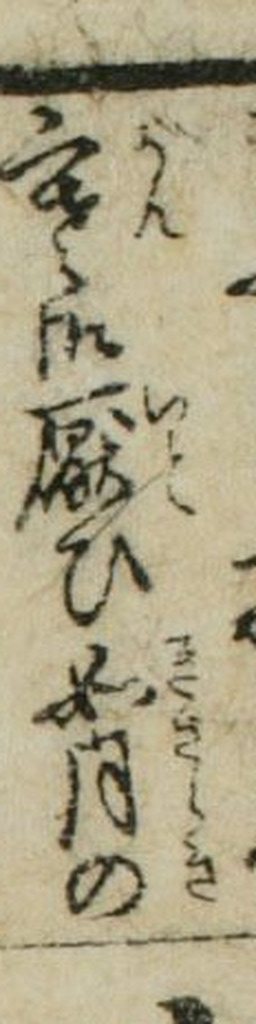寒御厭如月の
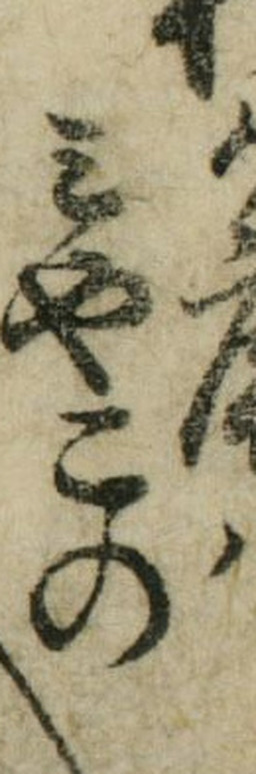みやこの
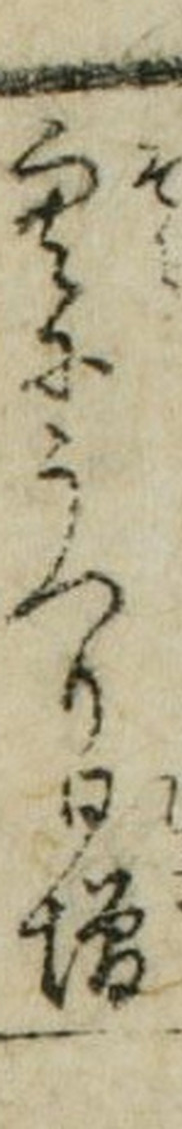空にうつり日増
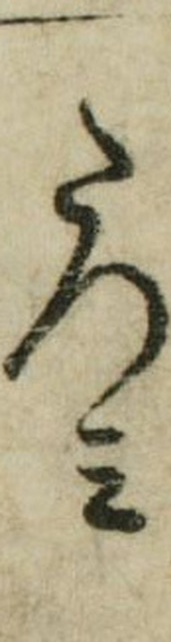たつみ
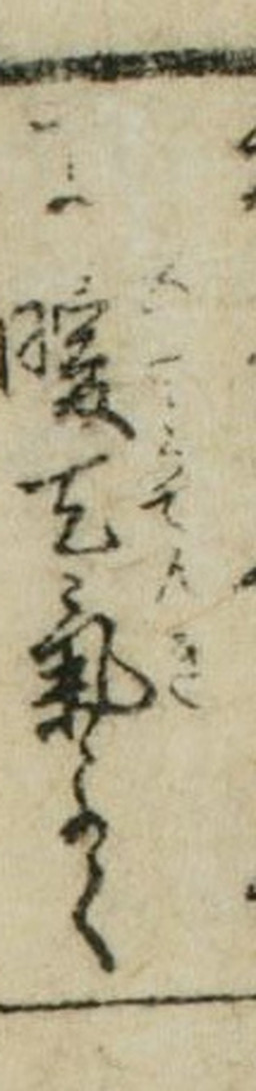に暖天気よく
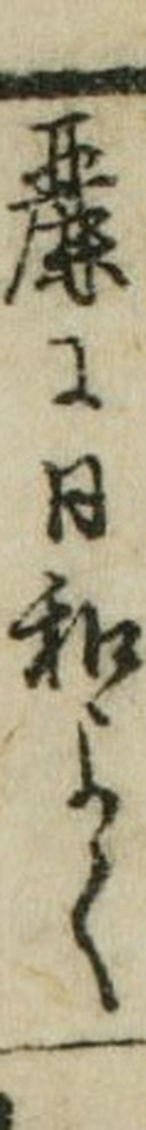麗に日和よく
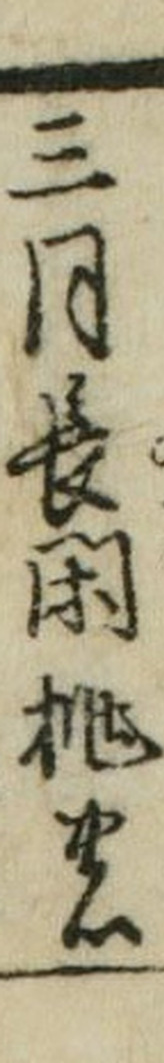三月長閑桃の
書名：百人一首
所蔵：東京学芸大学教育コンテンツアーカイブ
